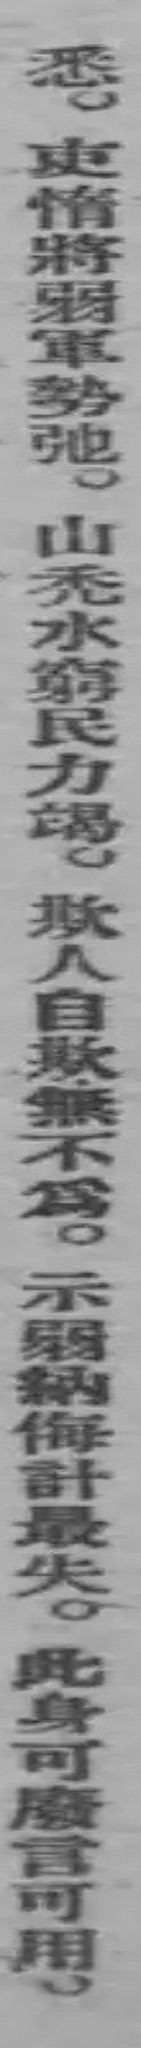悉。吏惰将弱軍勢弛。山禿水窮民力竭。欺人自欺無不為。示弱納侮計最失。此身可廃言可用。
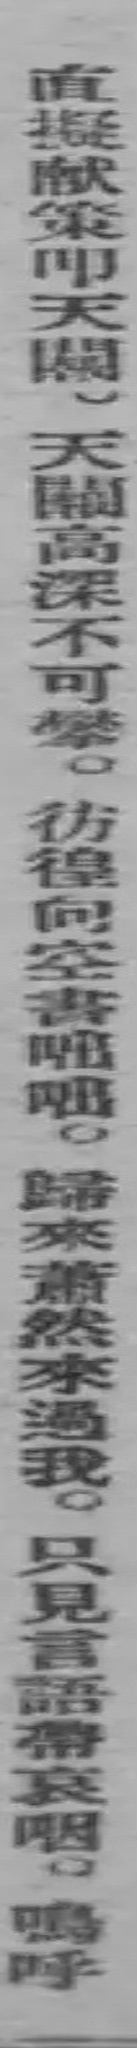直擬献策叩天𨷂。天𨷂高深不可挙。彷徨向空書咄咄。帰来蕭然来過我。只見言語帯哀咽。嗚呼
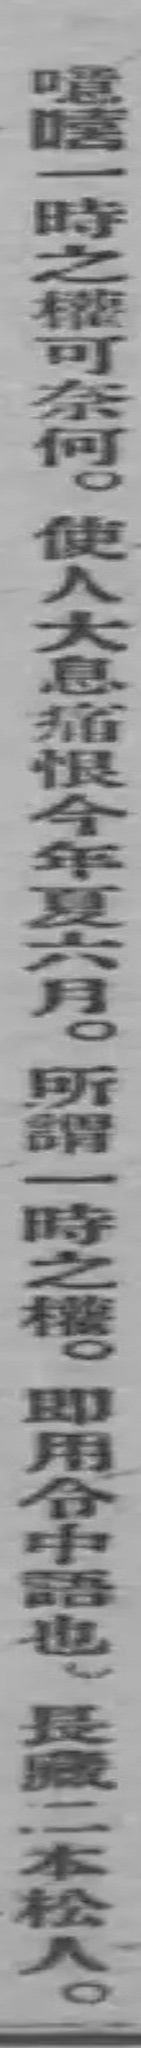噫暿一時之権可奈何。使人大息痛恨今年夏六月。所謂一時之権。即用令中語也。長蔵二本松人。
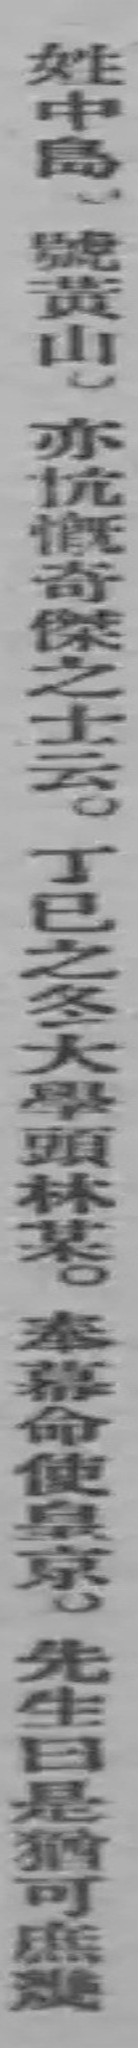姓中島。号黄山。亦抗概奇傑之士云。丁巳之冬大学頭林某。奉幕命使皇京。先生曰是猶可庶幾
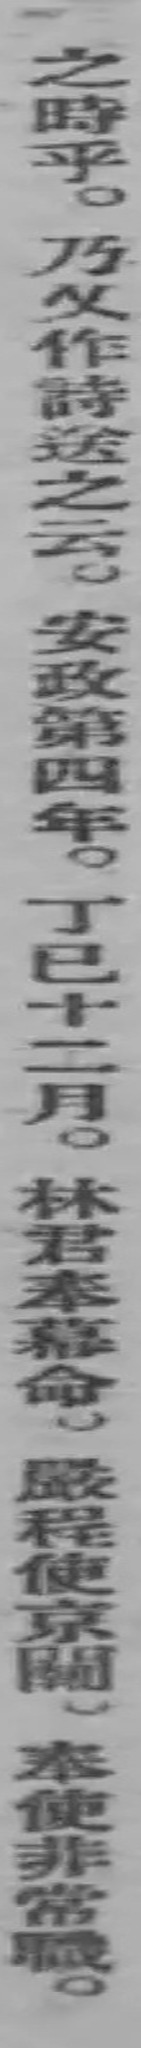之時乎。乃又作詩送之云。安政第四年。丁巳十二月。林君奉幕命。厳程使京𨷂。奉使非常職。
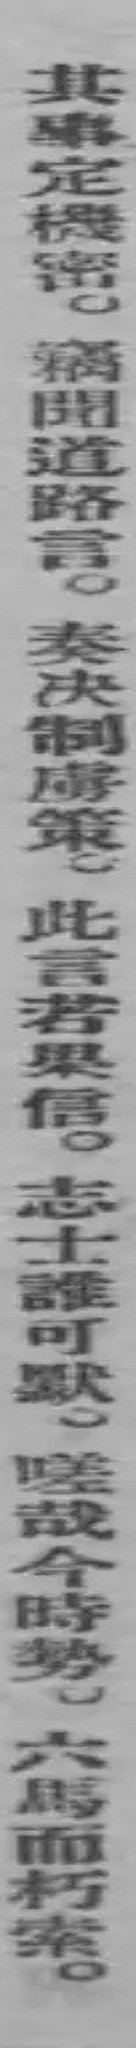其事定機密。竊開道路言。奏決制虜策。此言若果信。志士誰可黙。嗟哉今時勢。六馬而朽索。
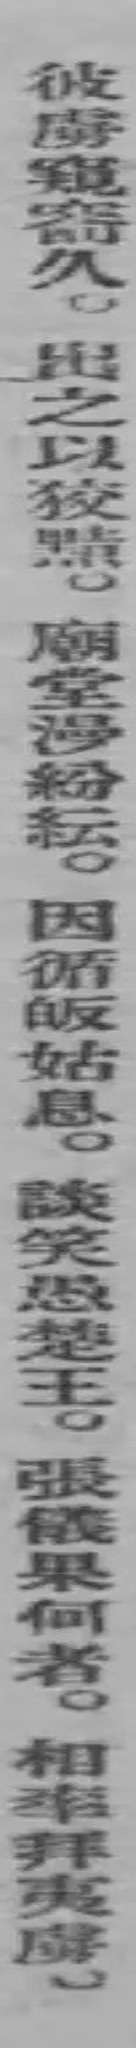彼虜窺窬久。出之以狡黠。廟堂漫粉紜。因循皈姑息。談笑愚楚王。張儀果何者。相率拝夷虜。
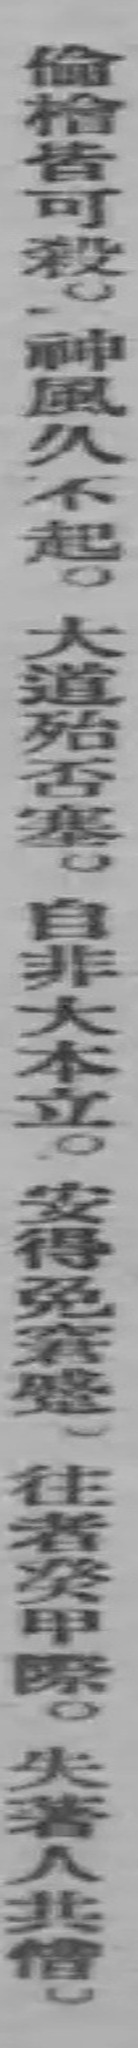倫檜皆可殺。神風久不起。大道殆否塞。自非大本立。安得免窘蹙。往者癸甲際。失著人共惜。
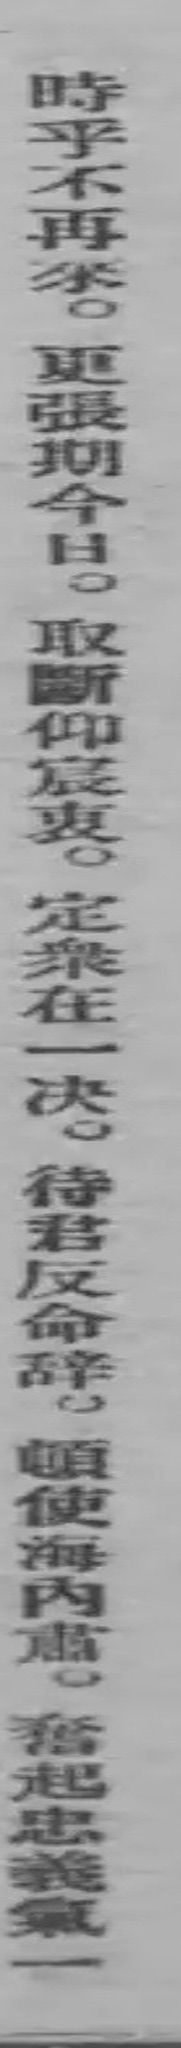時乎不再来。更張期今日。取断仰宸裏。定衆在一決。待君反命辞。頓使海内粛。奮起忠義気一
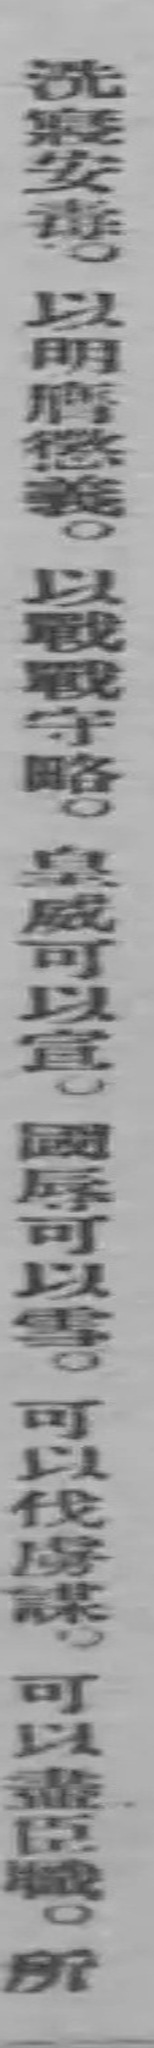洗寝安毒。以明膺懲義。以戦戦守略。皇威可以宣。国辱可以雪。可以伐虜謀。可以尽臣職。所
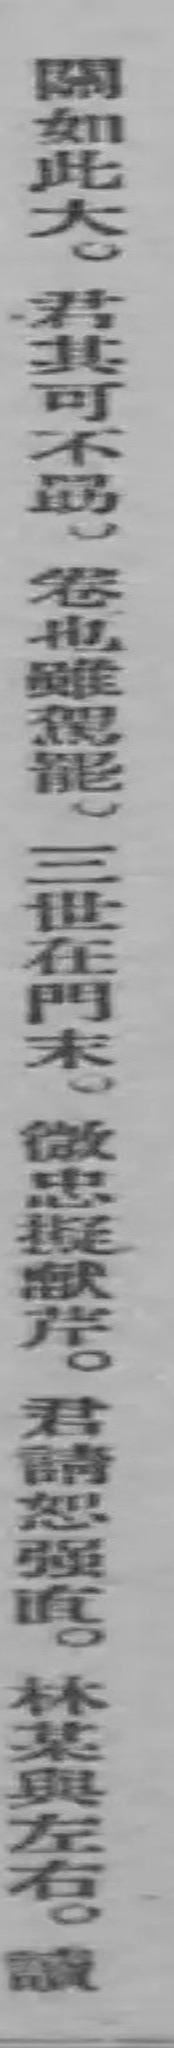関如此大。君其可不勗。巻也雖駕罷。三世在門未。微忠擬献芹。君請恕強直。林某與左右。読
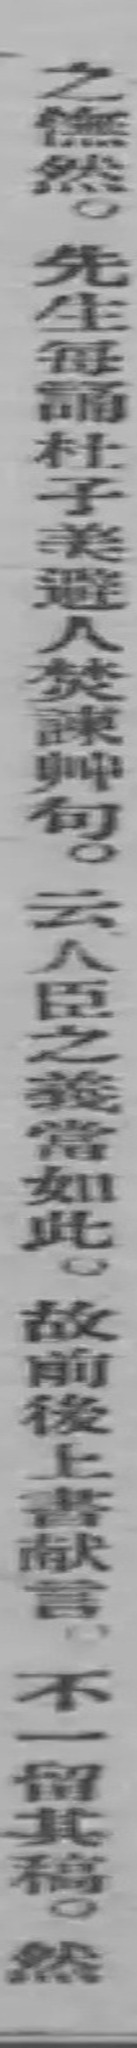之憮然。先生毎誦杜子美避人焚諌艸句。云人臣之義当如此。故前後上書献言。不一留其稿。然
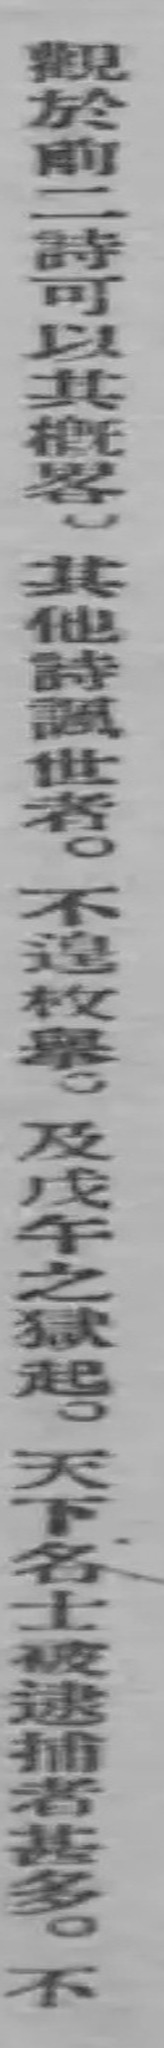観於前二詩可以其概略。其他詩諷世者。不遑枚挙。及戊午之獄起。天下名士被逮捕者甚多。不
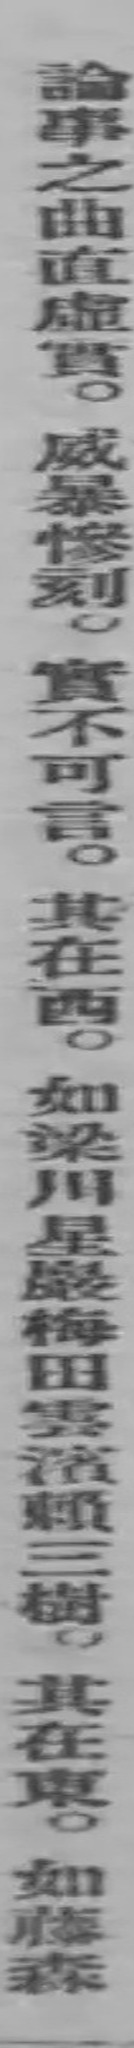論事之曲直虚実。威暴惨刻。実不可言。其在西。如梁川星嚴梅田雲浜頼三樹。其在東。如藤森
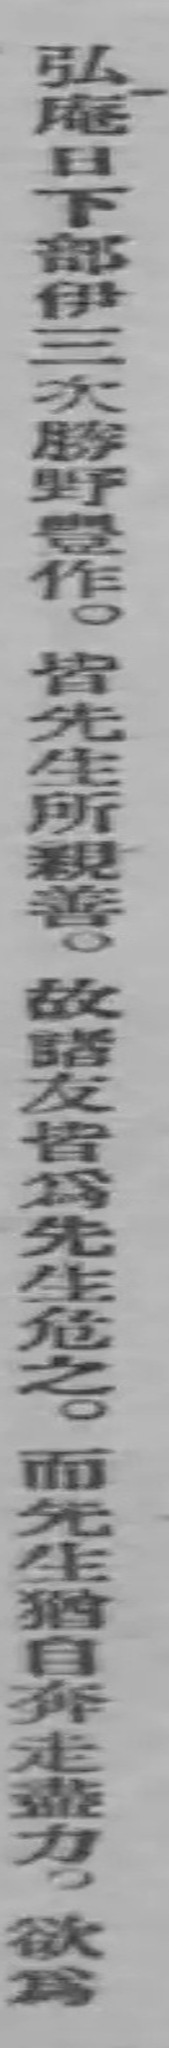弘庵日下部伊三次勝野豊作。皆先生所親善。故諸友皆為先生危之。而先生猶自奔走尽力。欲為
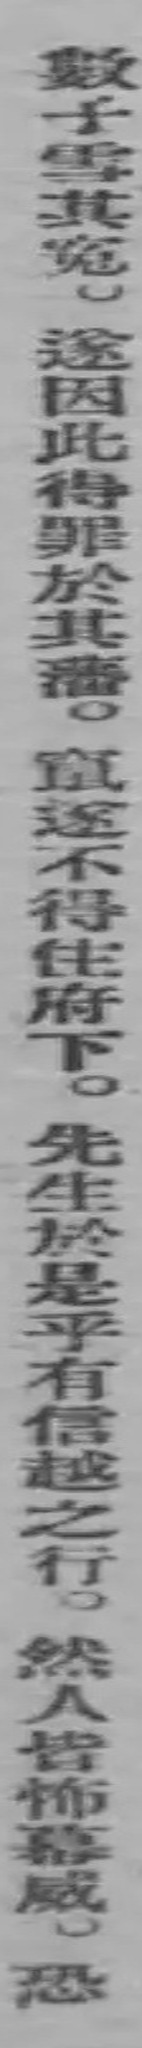数子雪其冤。遂因此得罪於其藩。竄遂不得住府下。先生於是乎有信越之行。然人皆怖幕威。恐
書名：豊橋市史談
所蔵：国立国会図書館 National Diet Library, JAPAN
